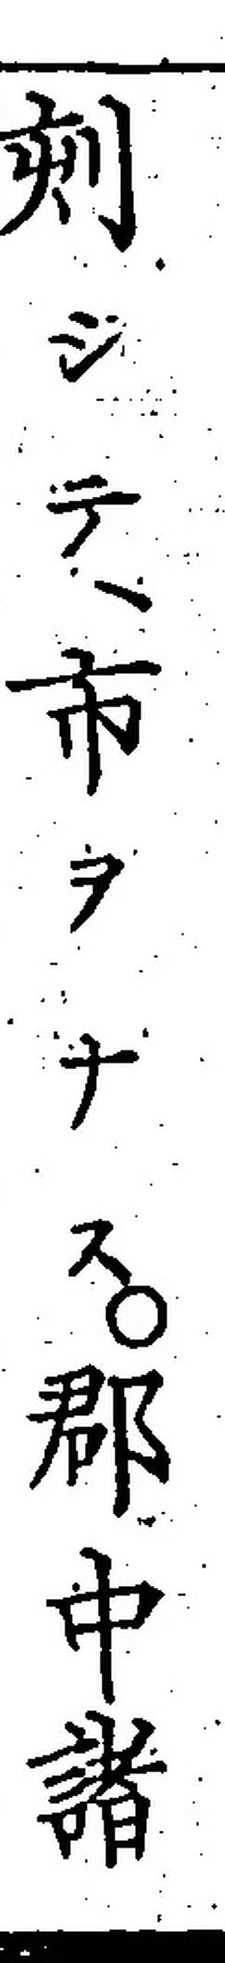刻シテ、市ヲナス。郡中諸
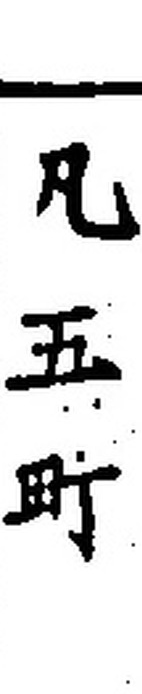凡五町
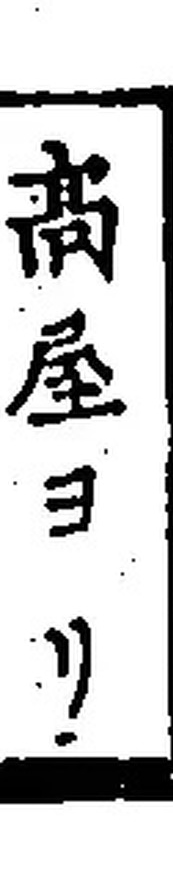高屋ヨリ
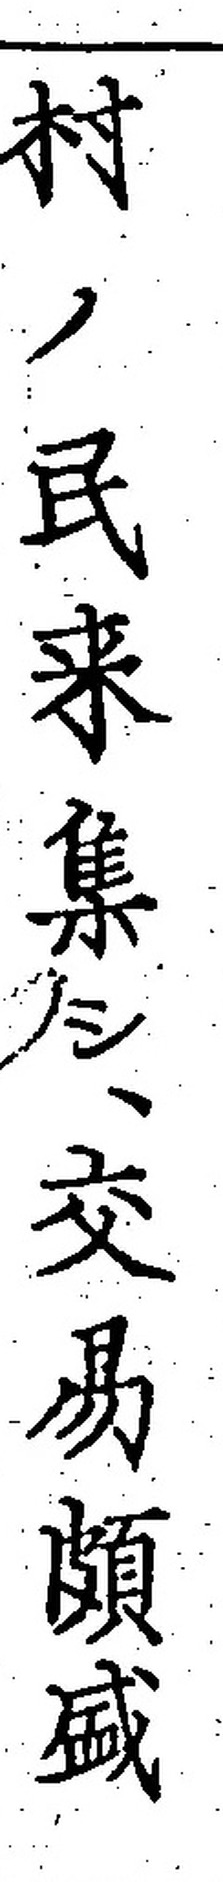村ノ民来集シ、交易頗盛
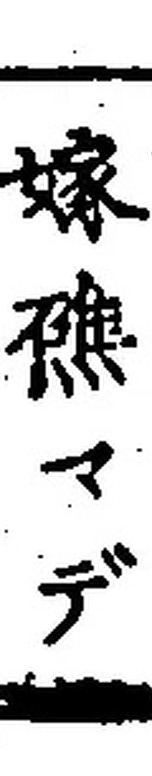嫁礁マデ
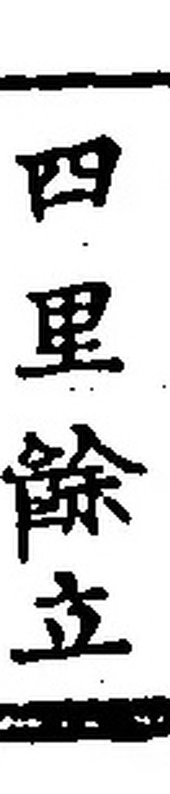四里余立
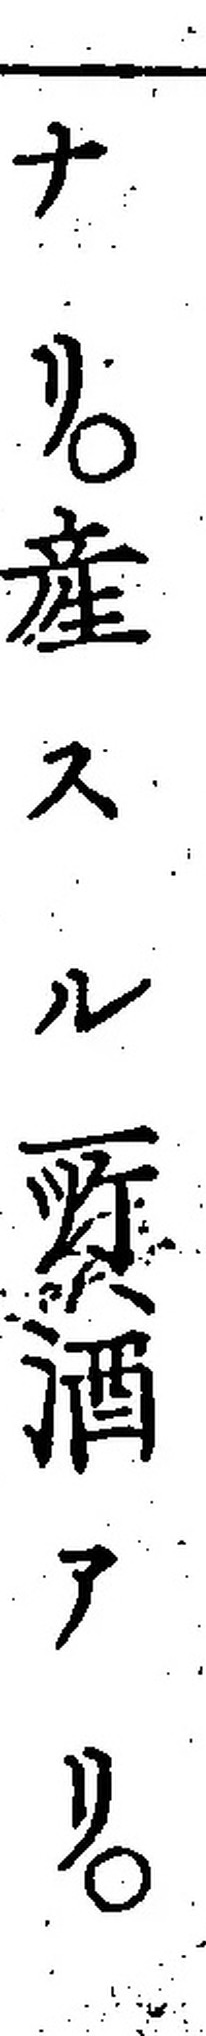ナリ。産スル所、酒アリ。
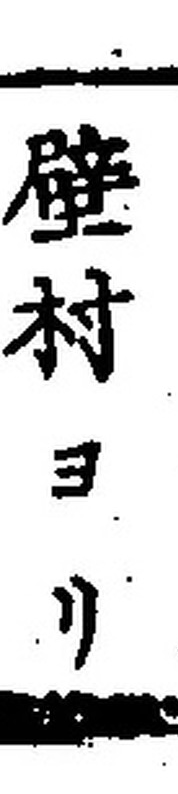壁村ヨリ

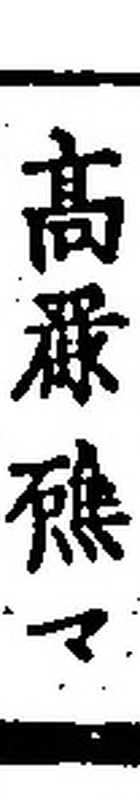高麗礁マ
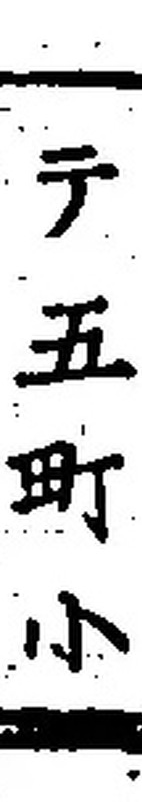テ五町小
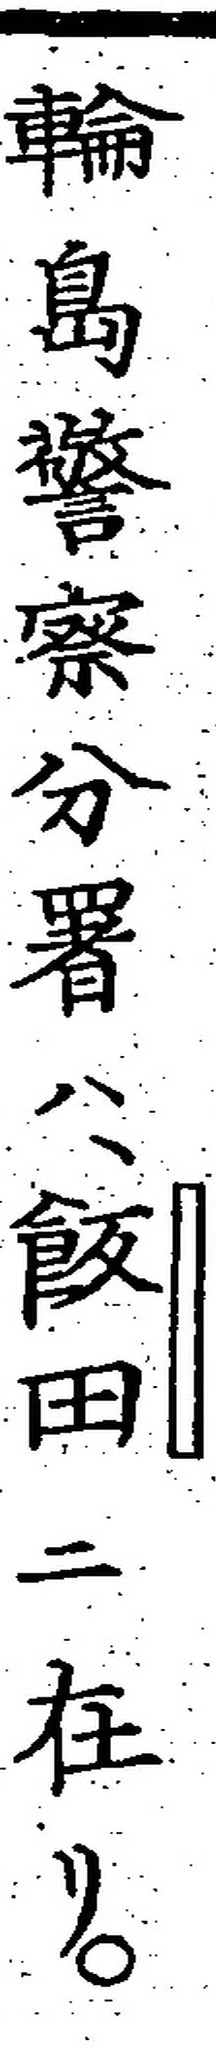輪島警察分署ハ、飯田ニ在リ。
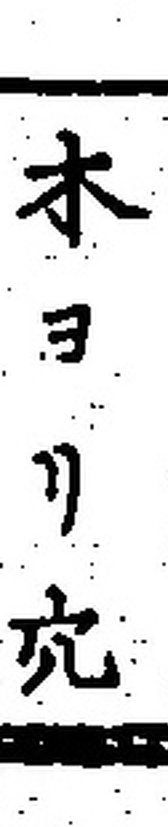木ヨリ穴
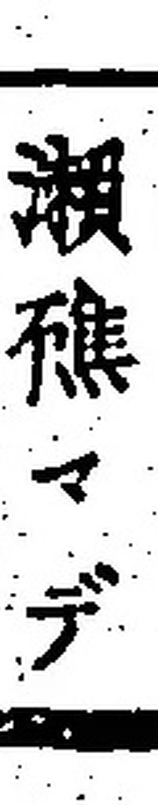瀬礁マデ
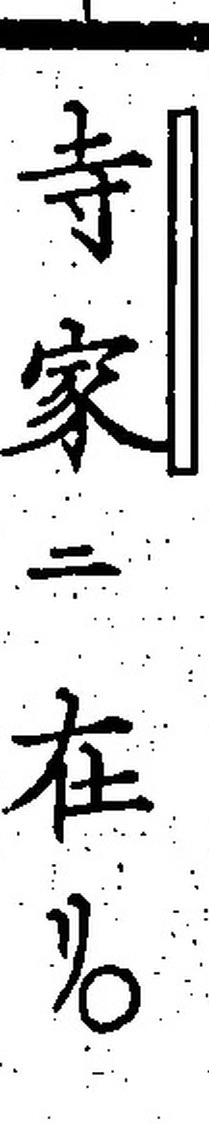寺家ニ在リ。
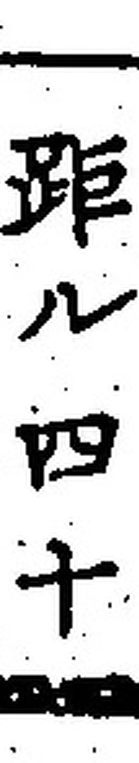距ル四十
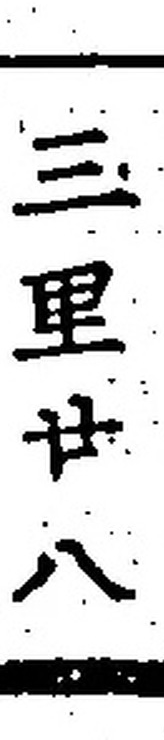三里廿八
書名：能登地誌略
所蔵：国立国会図書館 National Diet Library, JAPAN
